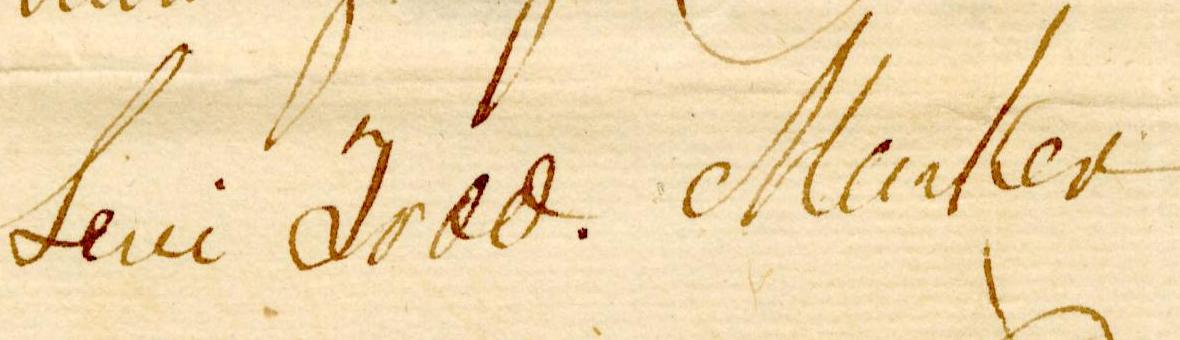Lewi Joad Manker
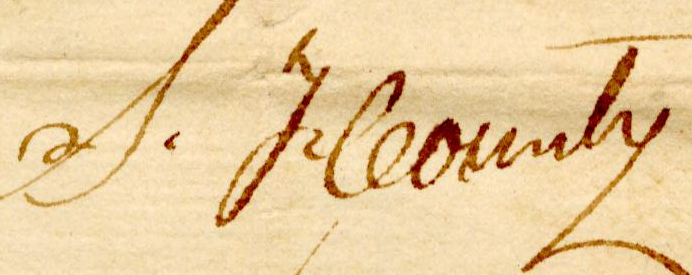S F County
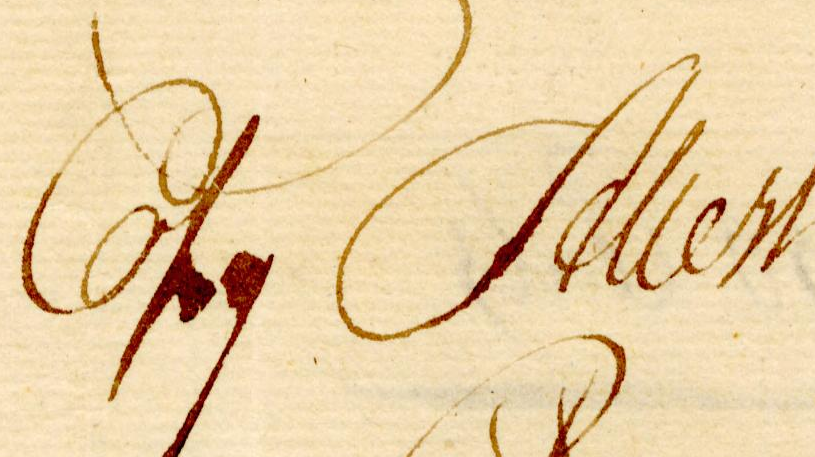By advent
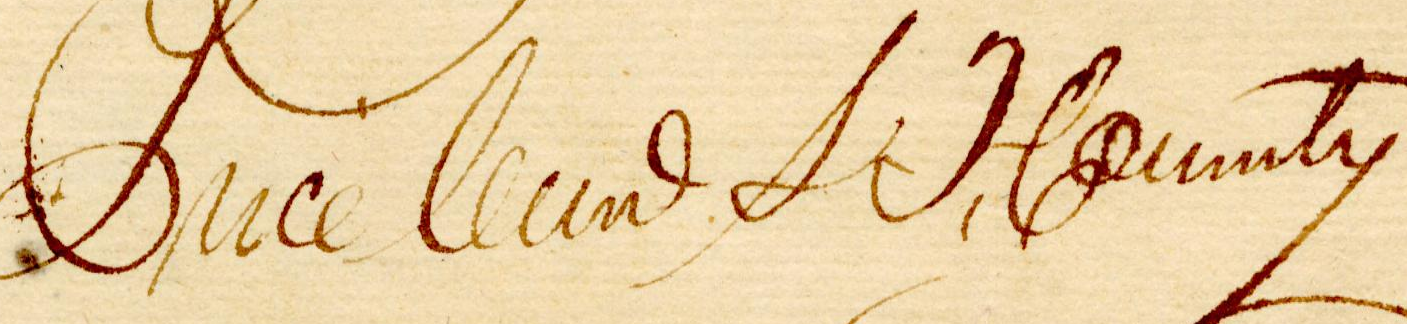Ince Cont S J County
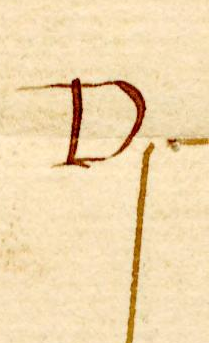D
